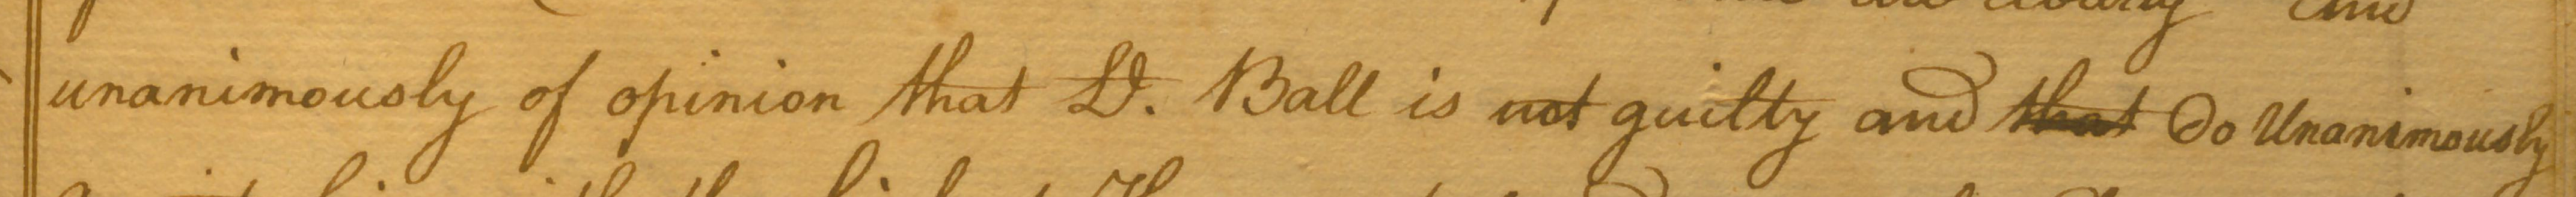unanimously of opinion that L^t. Ball is not guilty and [that] do Unanimously
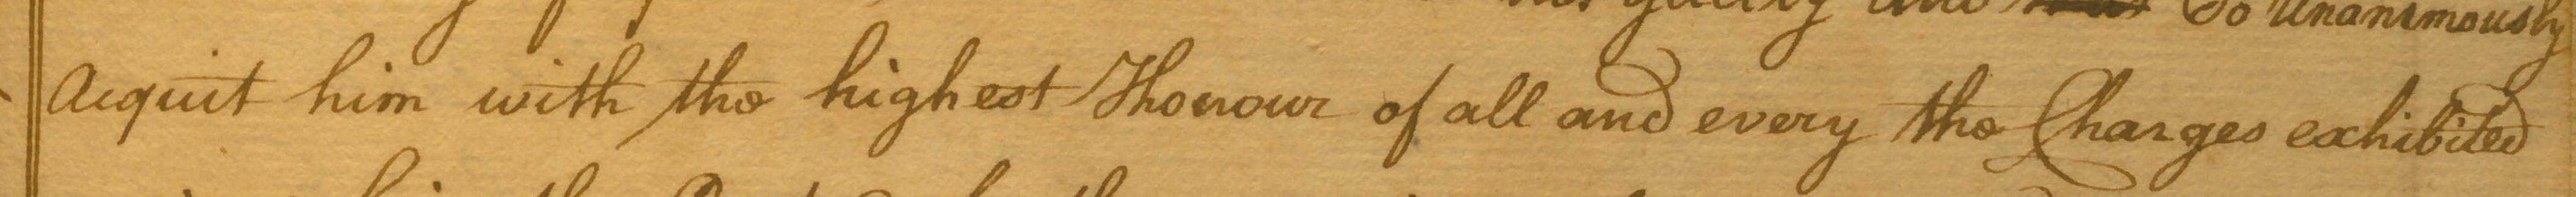Acquit him with the highest Honour of all and every the Charges exhibited
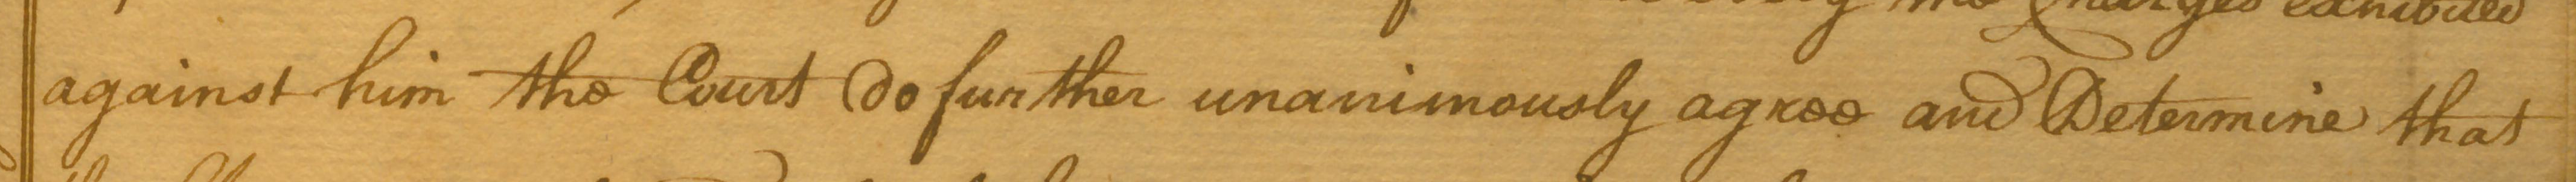against him the Court do further unanimously agree and Determine that
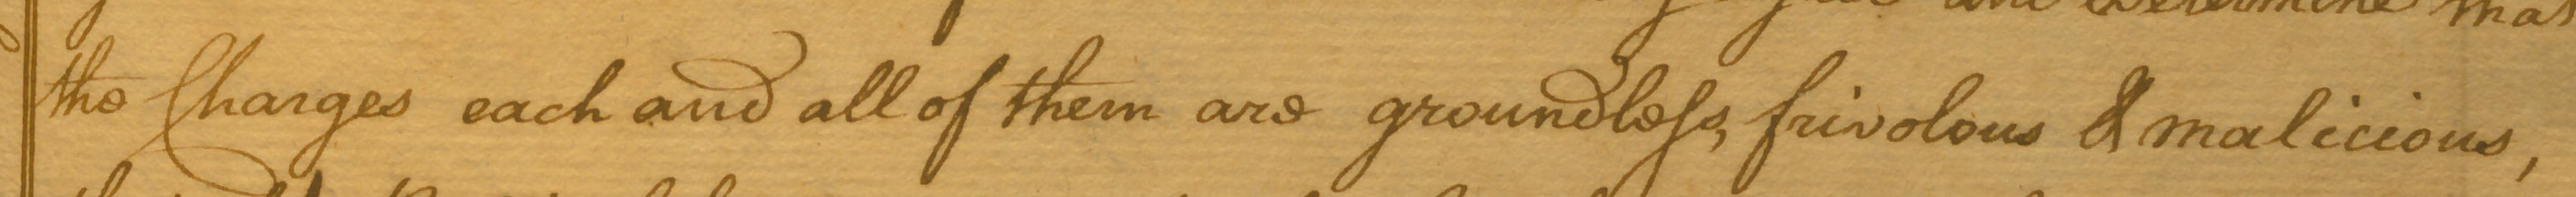the Charges each and all of them are groundless, frivolous & malicious,
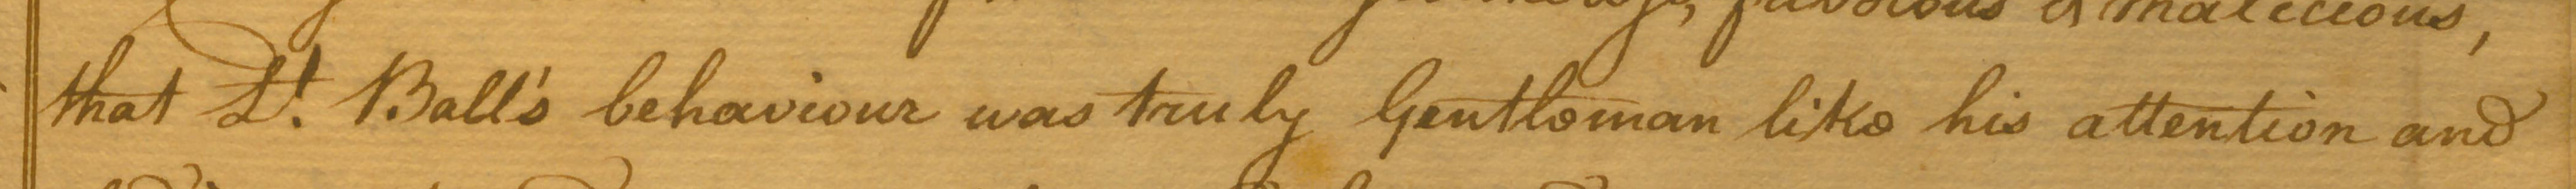that L^t. Ball's behaviour was truly Gentleman like his attention and
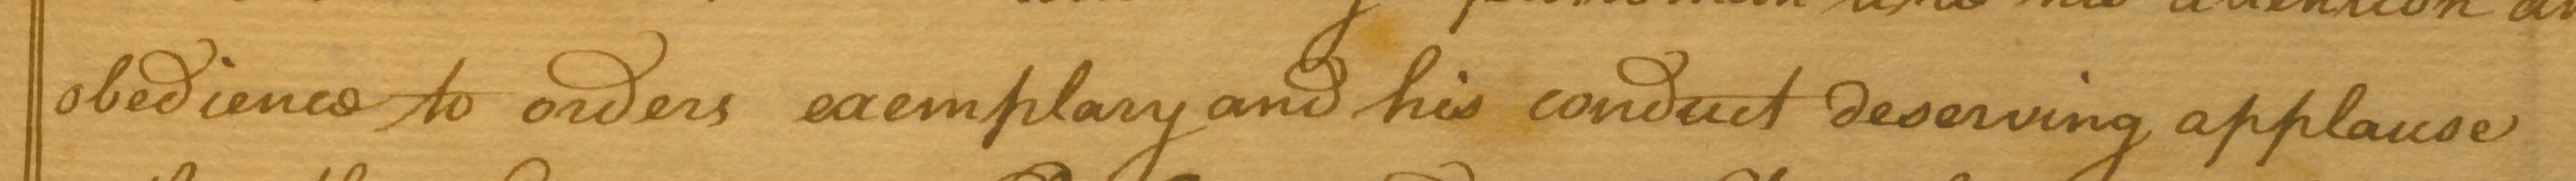obedience to orders exemplary and his conduct deserving applause
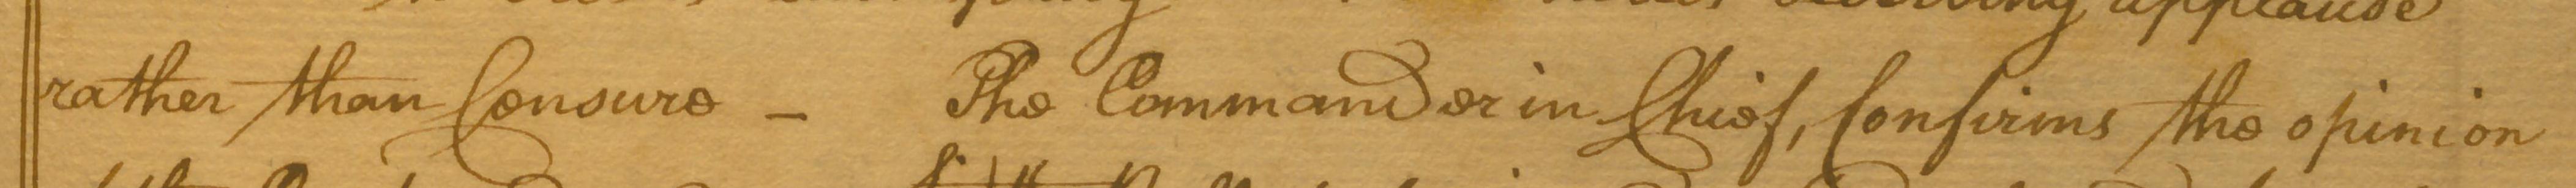rather than Censure- The Commander in Chief, Confirms the opinion
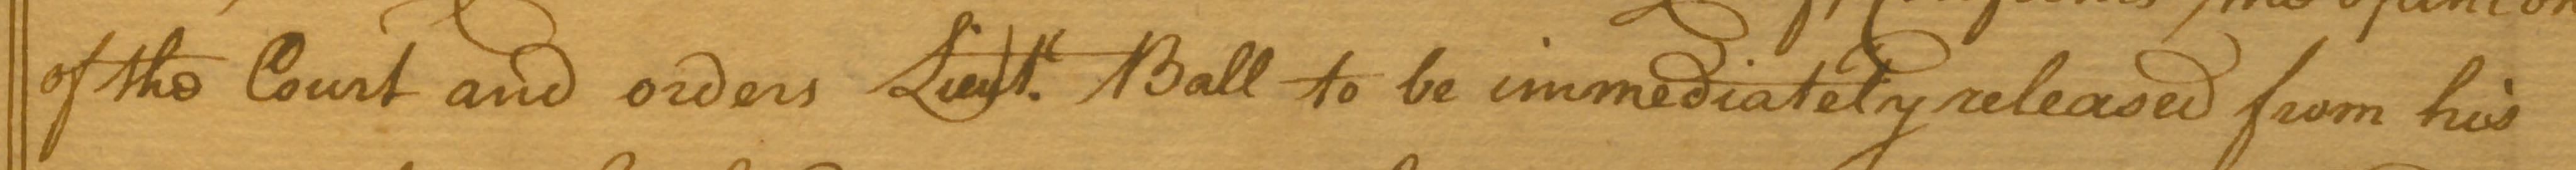of the Court and orders Lieut^t. Ball to be immediately released from his
